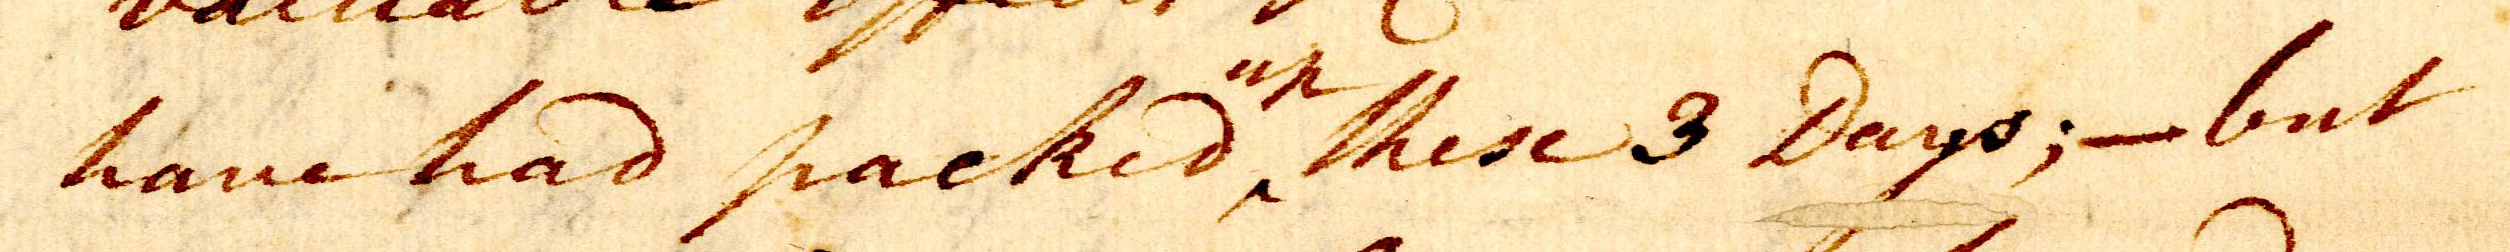have had packed ^up these 3 Days;- but
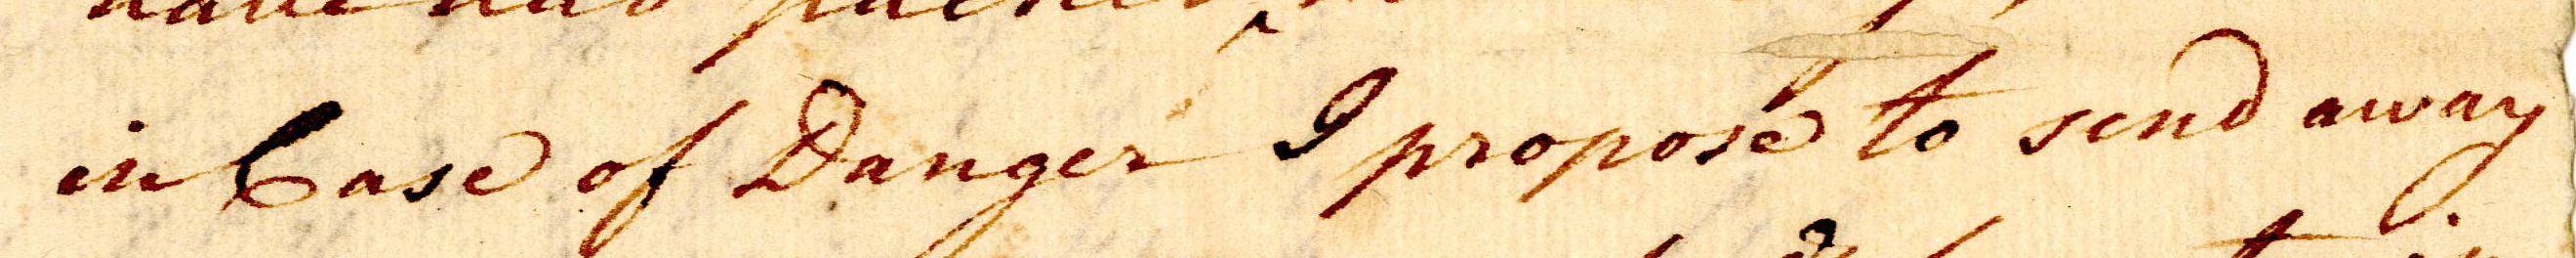in Case of Danger I propose to send away
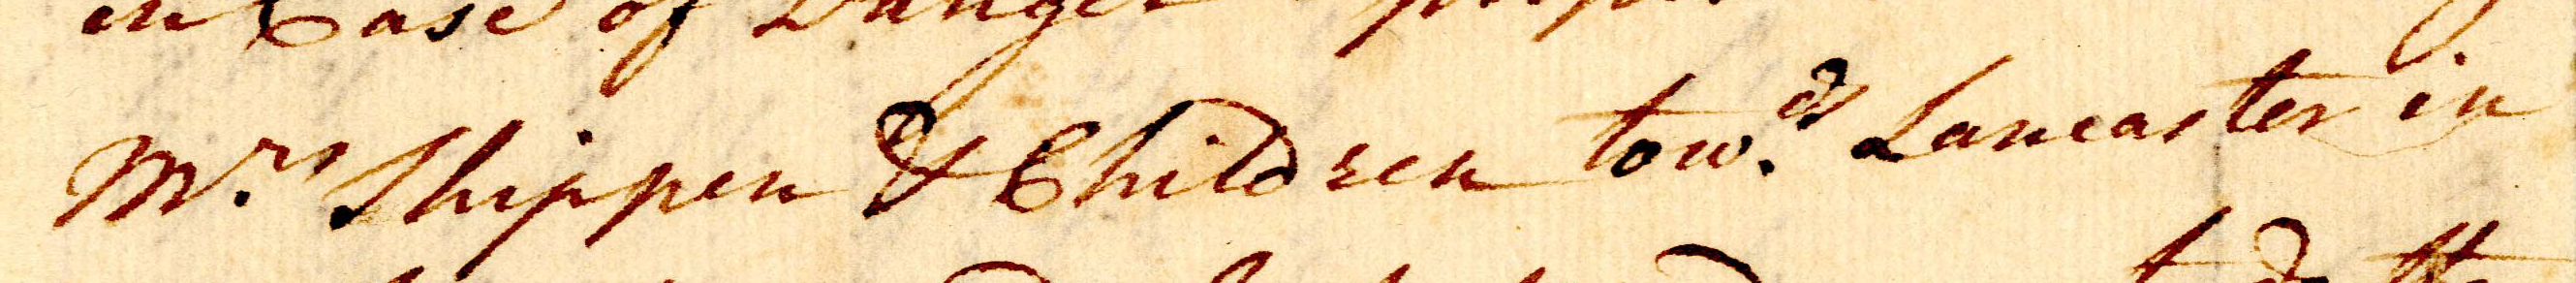M^rs. Shippen & Children tow^d. Lancaster in
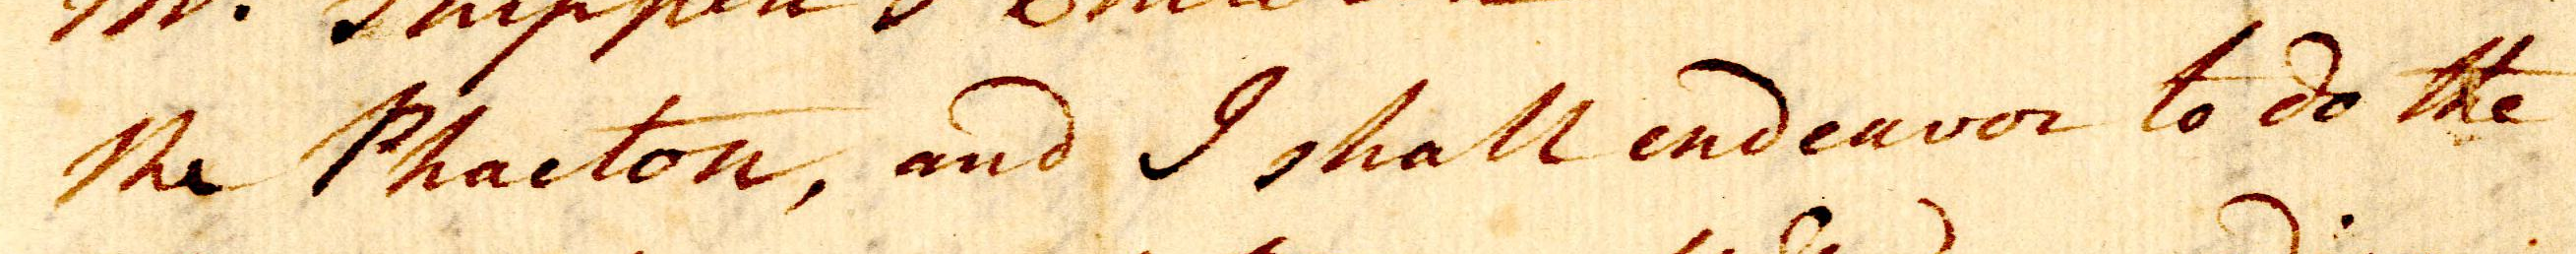the Phaeton, and I shall endeavor to do the
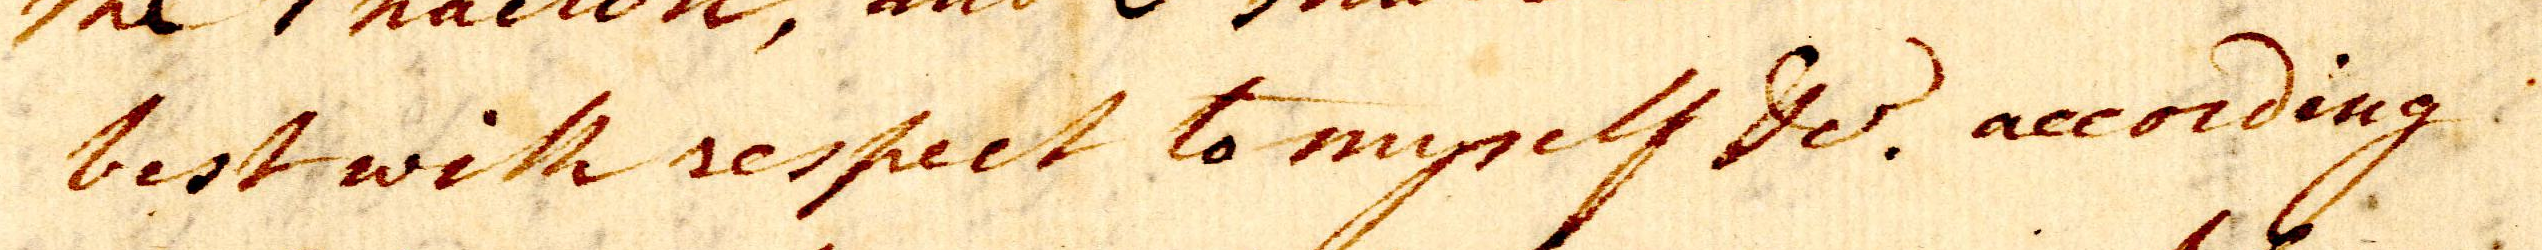best with respect to myself &c. according
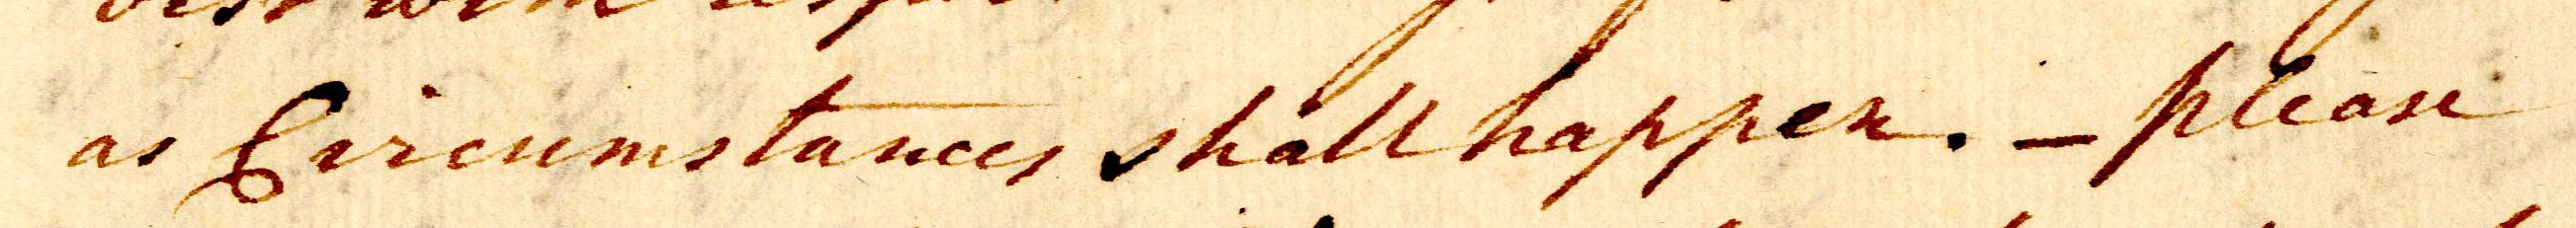as Circumstances shall happen.- Please
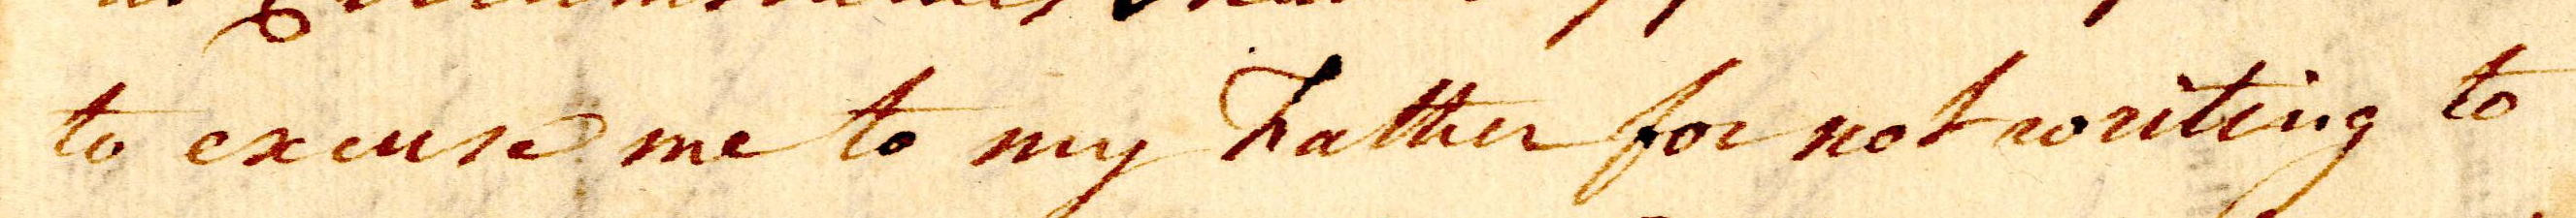to excuse me to my Father for not writing to
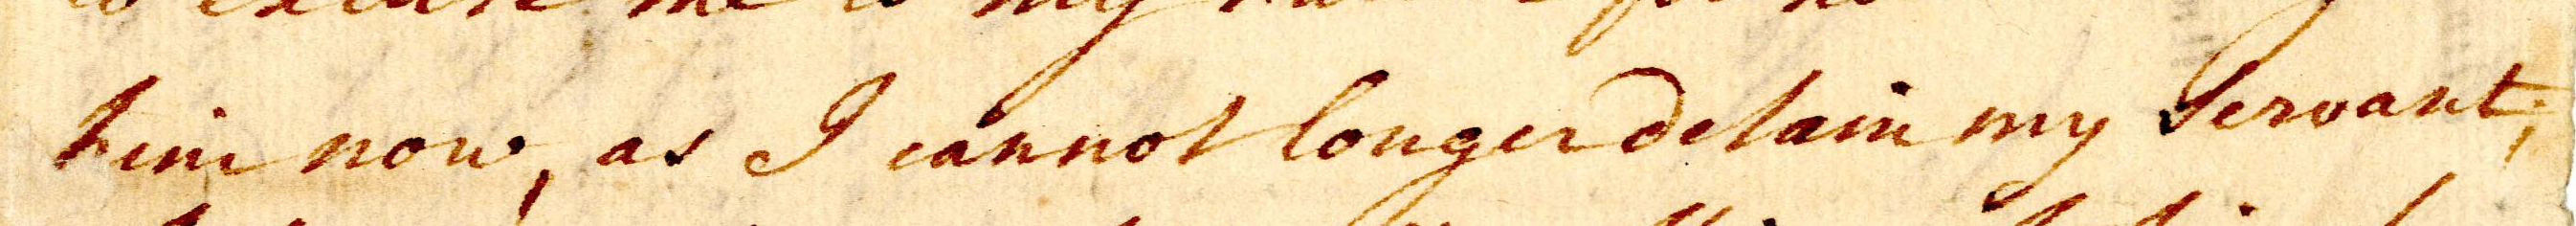him now, as I cannot longer detain my servant;
